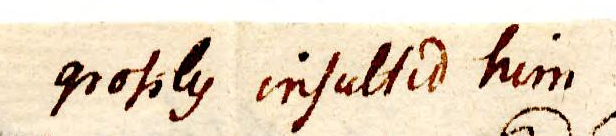grossly insulted him
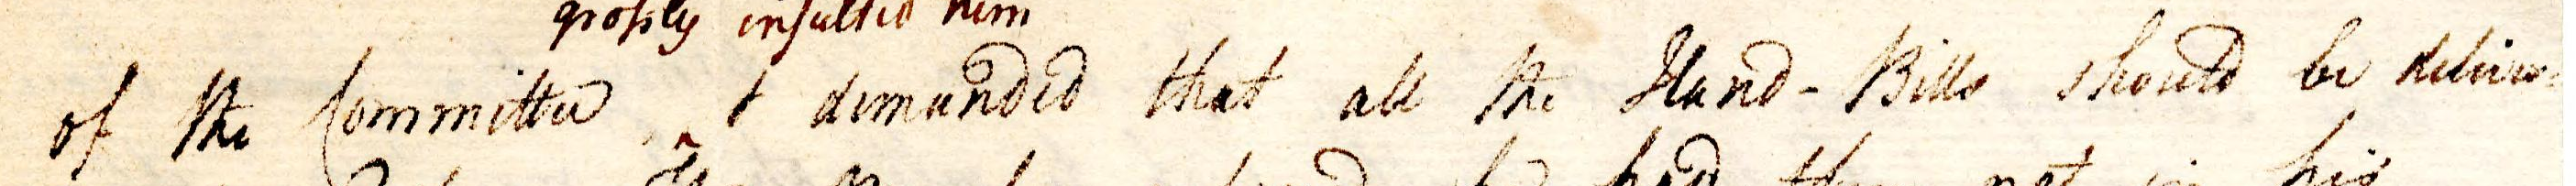of the Committee ^ & demanded that all the Hand-Bills should be deliver-
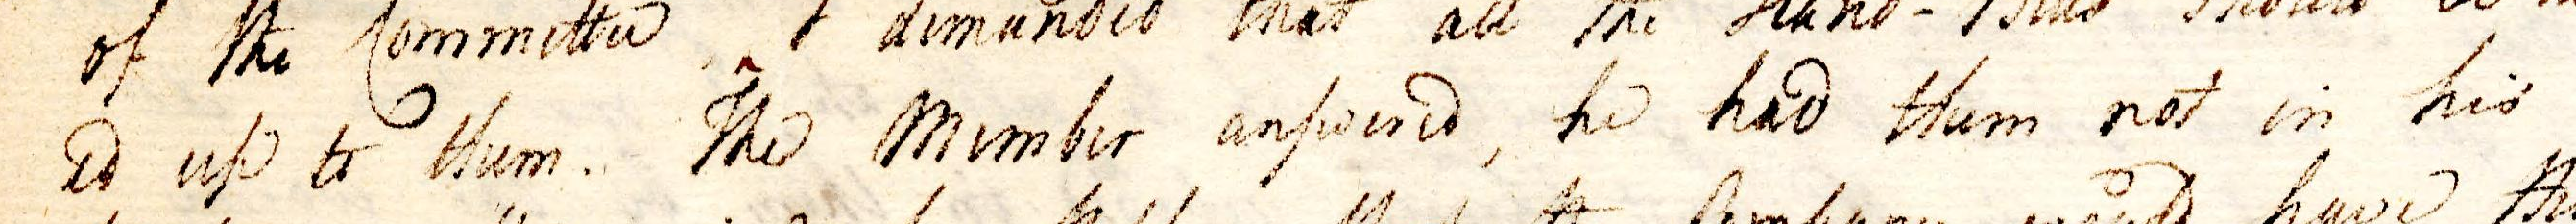-ed up to them. The Member answered he had them not in his
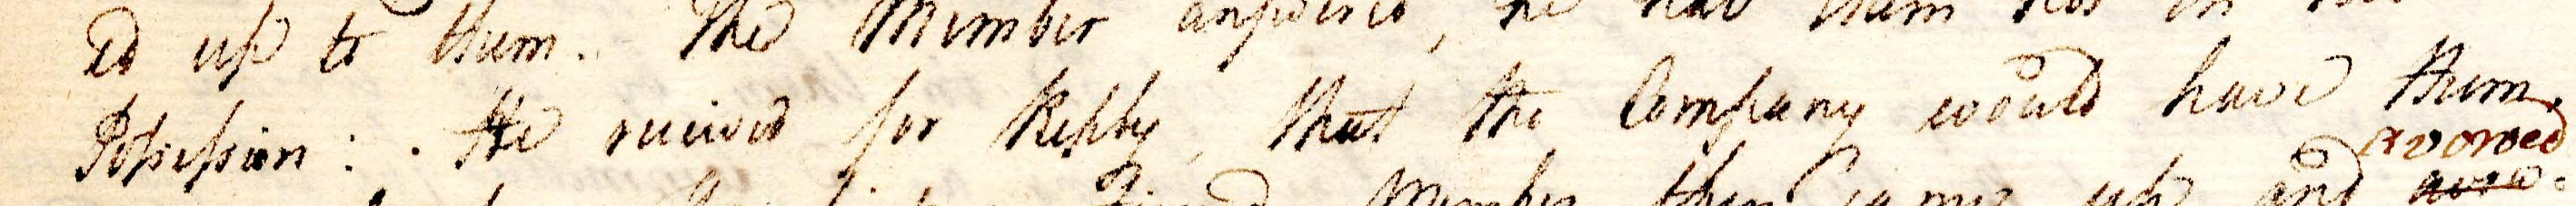Possession: He received for Reply that the Company would have them
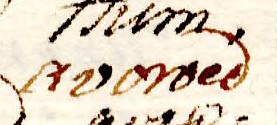vowed
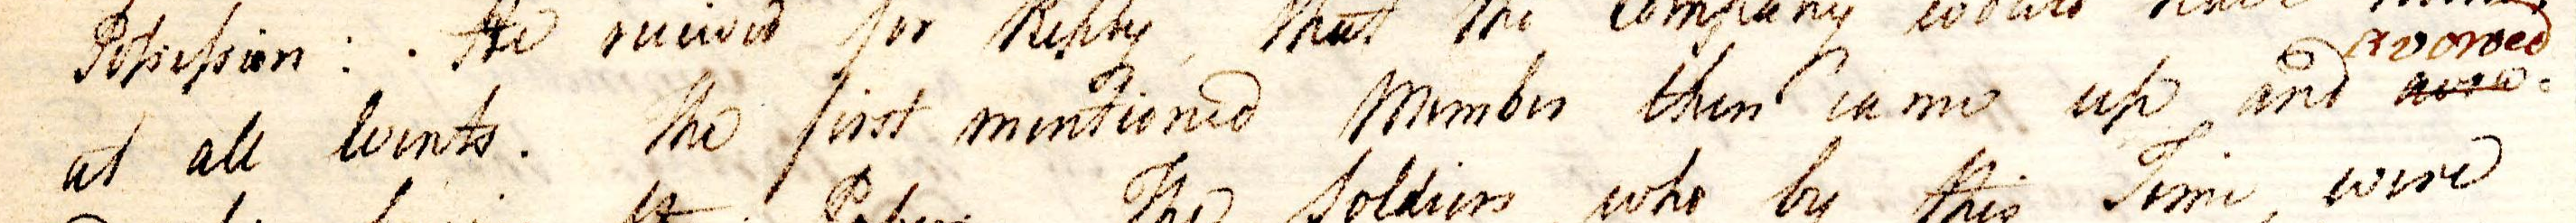at all Events. The first mentioned Member then came up, and ^ avow-
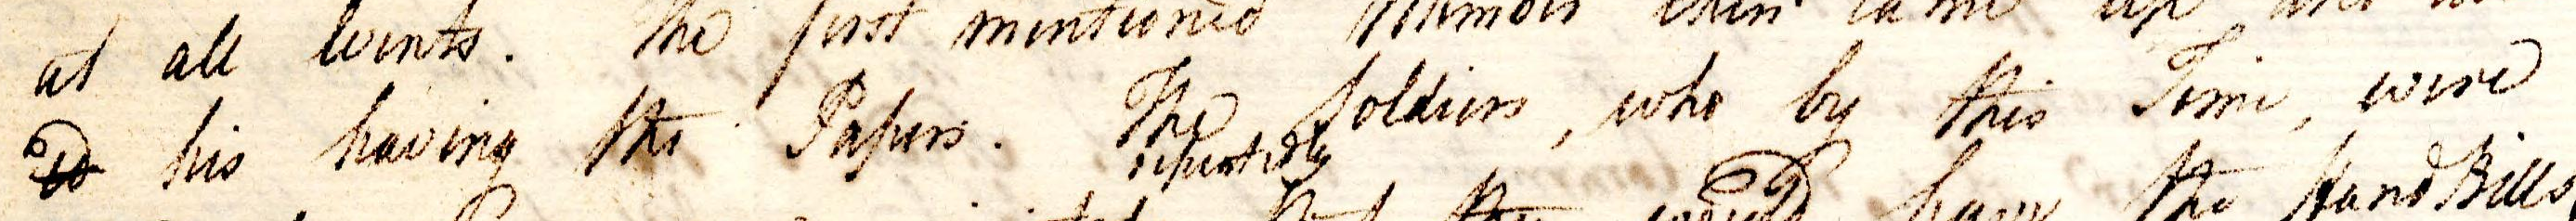-ed his having the Papers. The Soldiers, who by this Time were
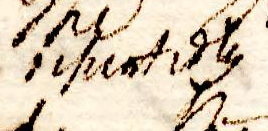repeatedly
